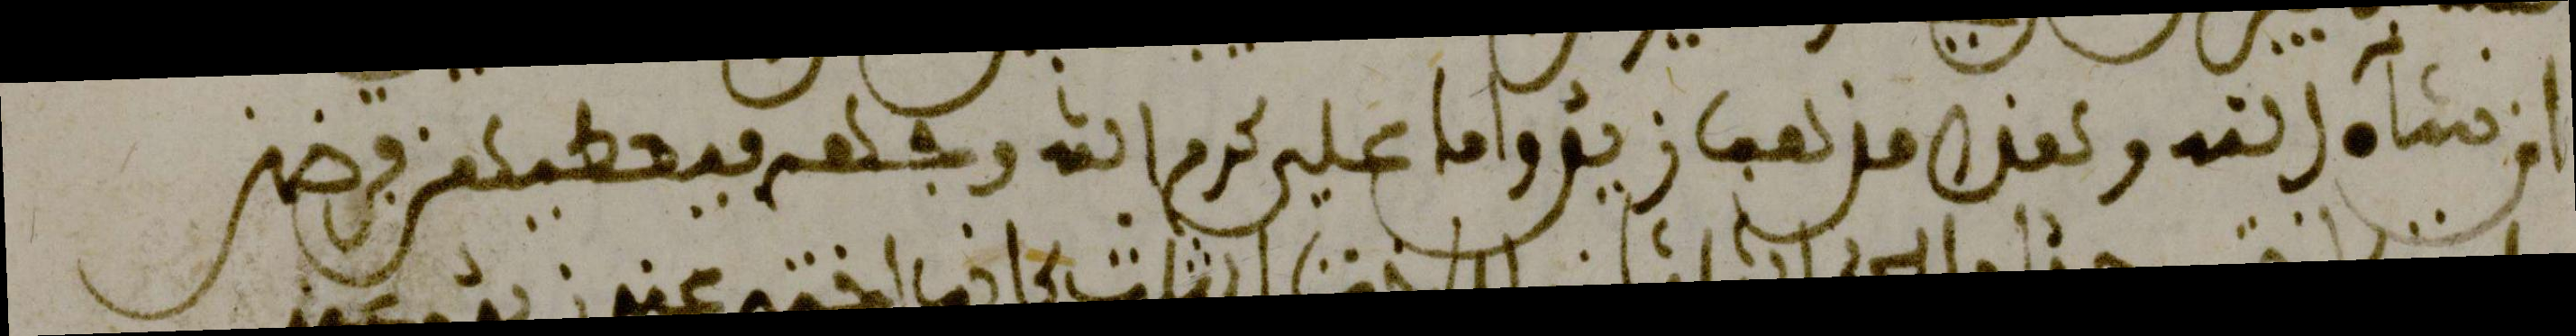ان شاء الله وهذا من مذهب زيد واما على كرم الله وجهه فيعطيهن فرضهن
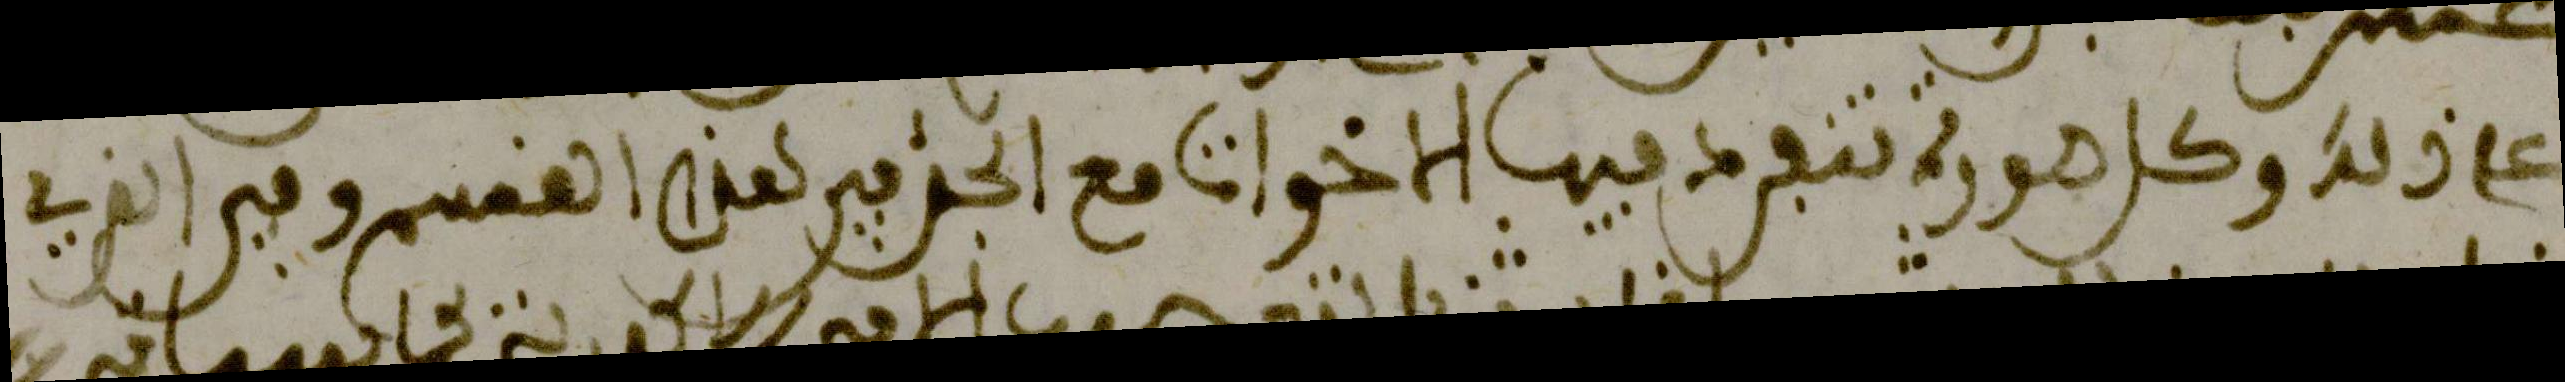على ذلك وكل صورة تنفرد فيها الاخوات مع الجد في هذا القسم وفي الذي
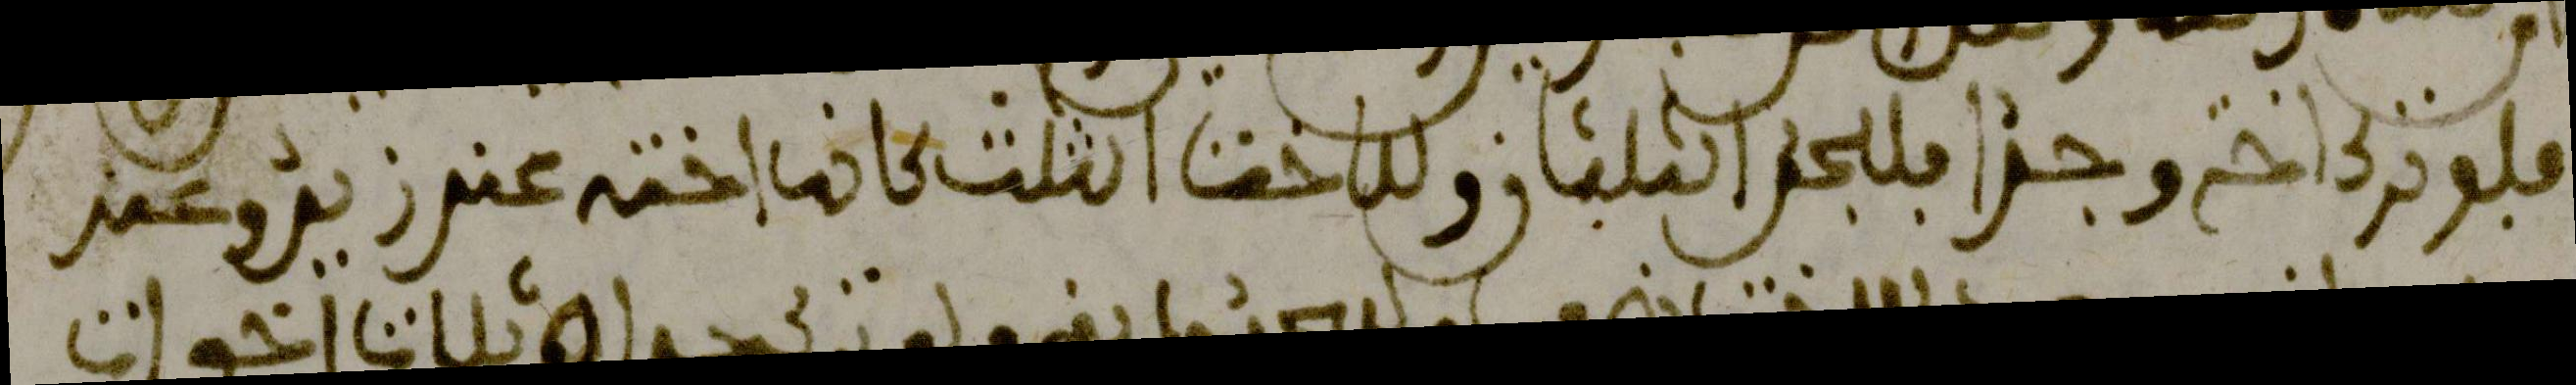فلو ترك اخة وجدا فللجد الثلثان وللاخت الثلث كانها اخته عند زيد وعند
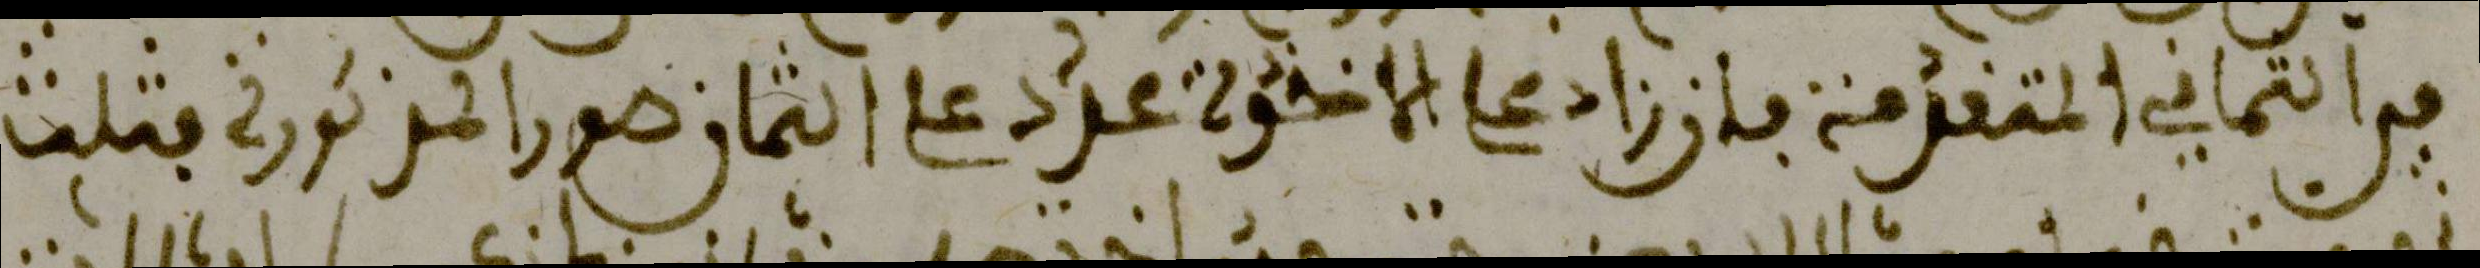في الثماني المتقدمة فان زاد على الاخوة عدد على الثمان صور المذكور فثلث
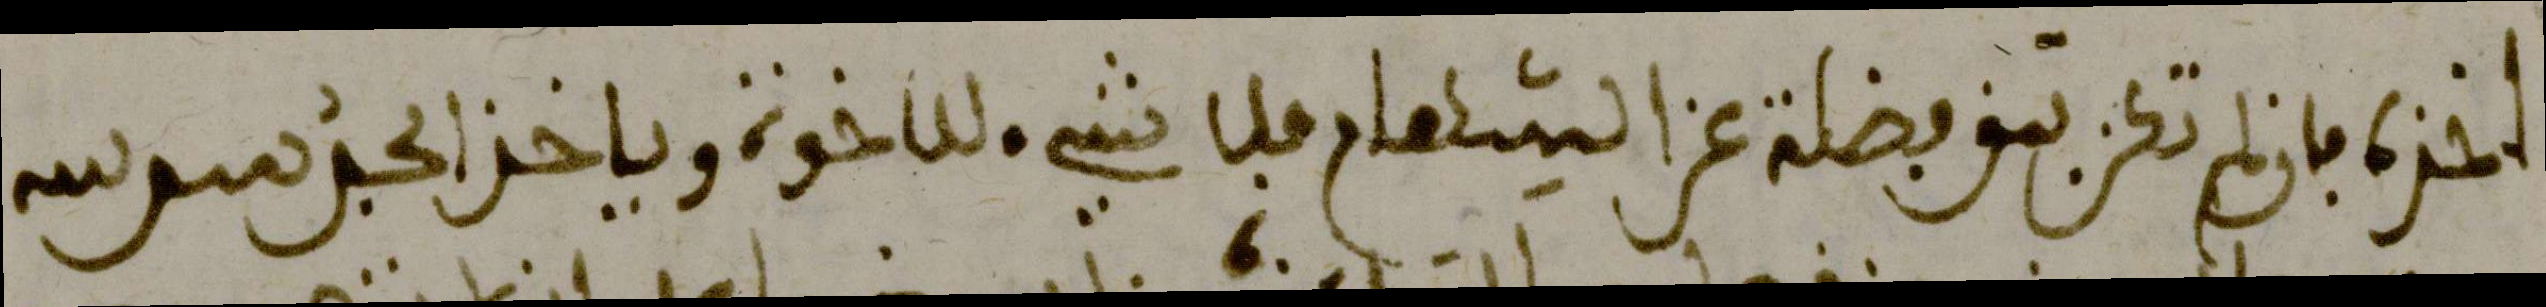واخذه فان لم تكن تبق فضلة عن السِّهام فلا شيء للاخوة وياخذ سدسه
